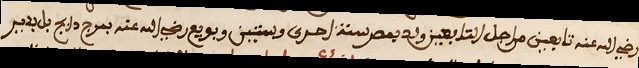رضي الله عنه تابعين من اجل التابعين ولد بمصر سنة احدى وستين وبويع رضي الله عنه بمرج ذالج بل بدير
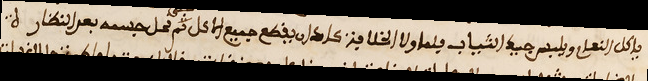ياكل النعام ويلبس جيد الثياب فلما ولا الخلافة كاد ان يقطع جميع الاكل ثم نحل جسمه بعد النظارة
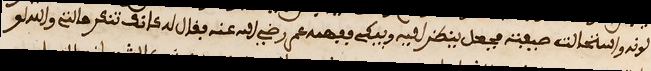لونه واستحالت صيفته فجعل ينظر اليه يبكى ففهمه عمر رضي الله عنه فقال له كانك تنكر حالتى والله لو
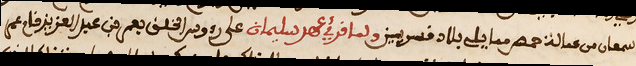سمعان من عمالة حمص مما يلى لاد قسريين ولما قريء عهد سليمان على رءوس الخلق بعمر بن عبد العزيز قام عمر
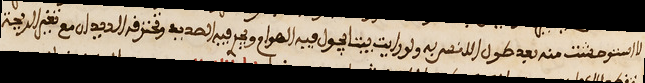لا ستو حشت منه بعد طول الانس به ولو رايت بيتا يجول فيه الهوام ويجرى فيه الصديد وتخترقه الديدان مع تغير الريحة
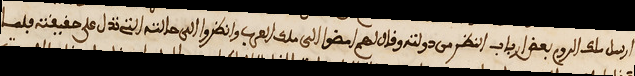ارسل ملك الروم بعض ارباب النظر من دولته وقال لهم امضوا الى ملك العرب وانظروا الى حالته التي تدل على حقيقته فلما
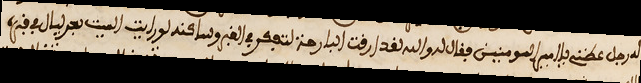له رجل عظنى يا امير المومنين فقال له والله لقد ارقت البارحة لتفكر في القبر وساكنه لو رايت الميت بعد ليال في قبره
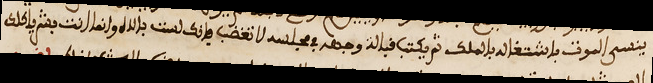ينسى الموت باشتغاله بالملك ثم يكتب قبالة وجهه في مجلسه لا تغضب فانك لست بالاه وانما انت بشر ياكلك
